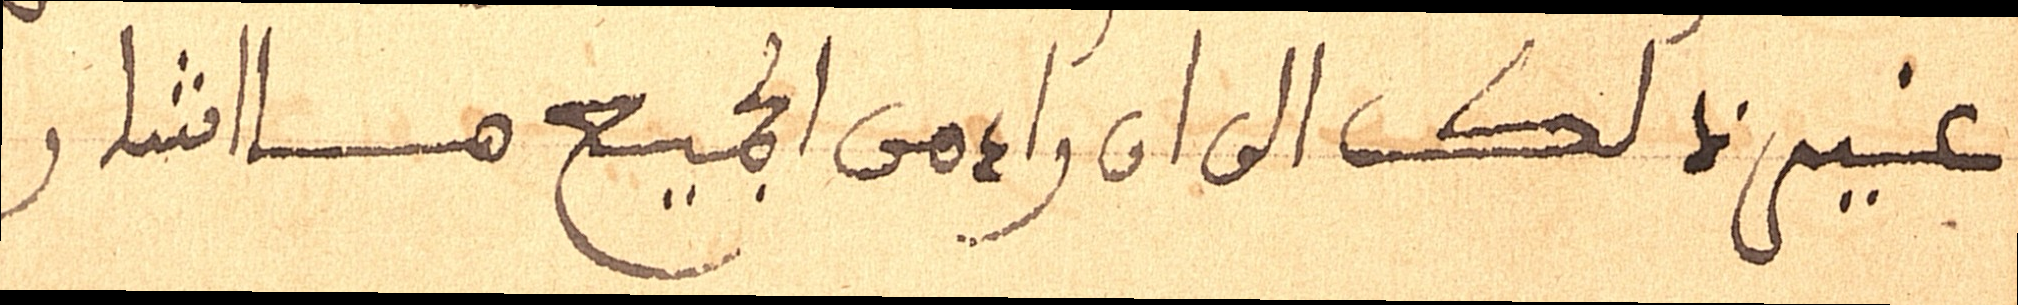غير ذلك الى ان راء من الجميع ما اشار
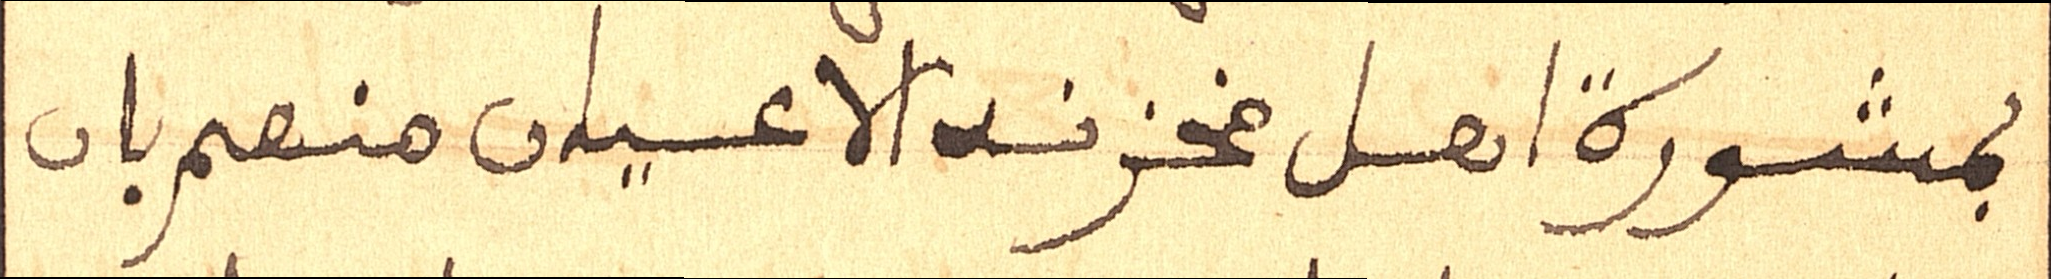بمشورة اهل مخزنه الاعيان منهم بان
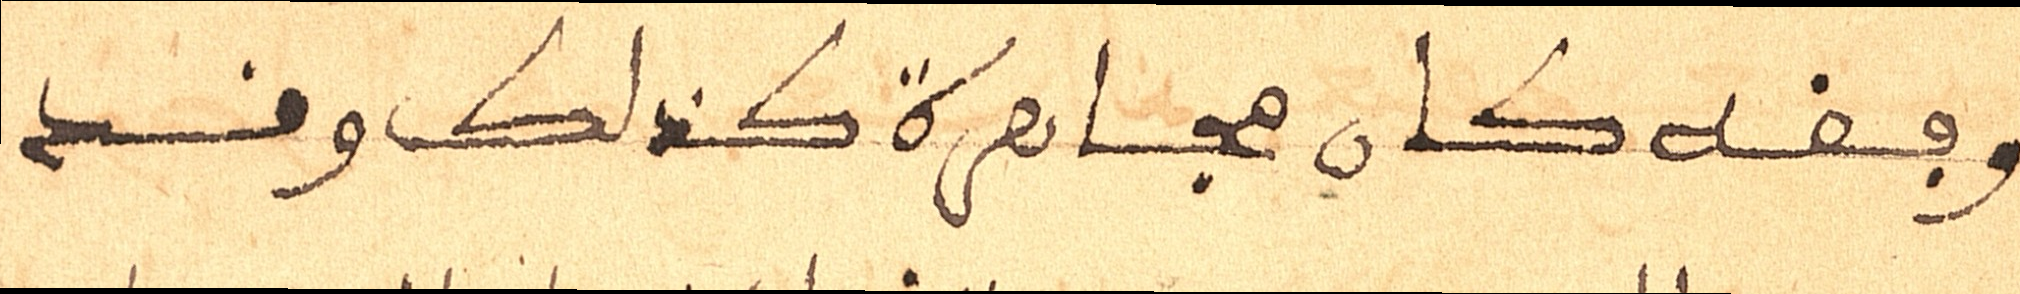وفقه كان مجاهرة كذلك وقد
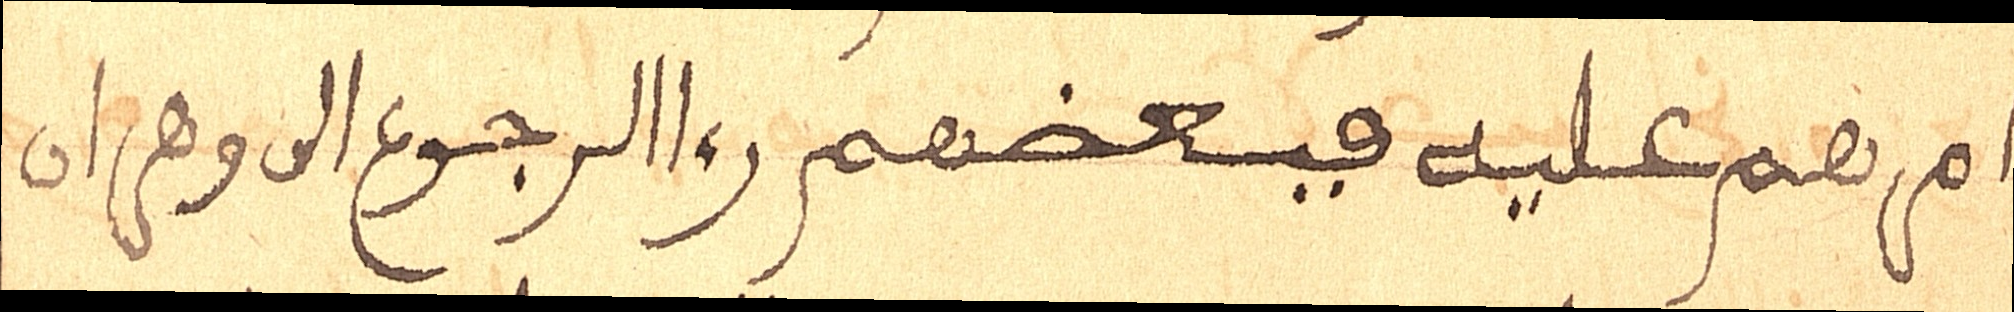امرهم عليه فيعضهم رءا الرجوع الى وهران
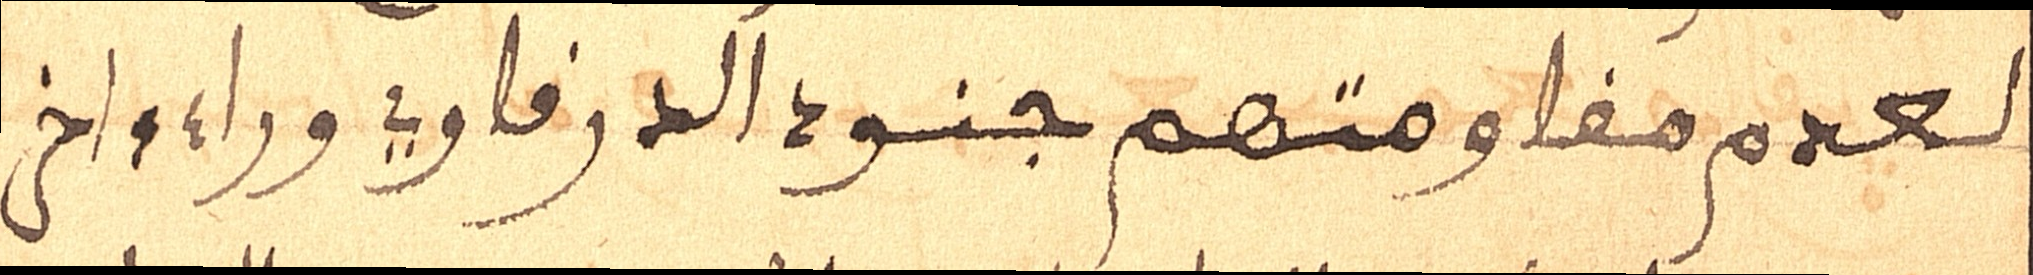لعدم مقاومتهم جنود الدرقاوي وراءءاخر
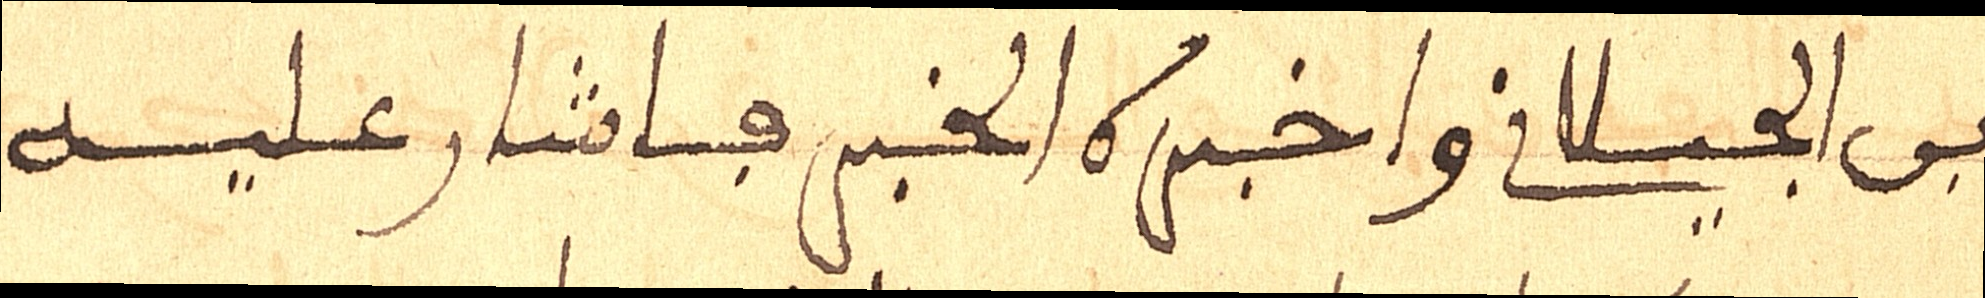بن الجملاني واخبره الخبر فاشار عليه
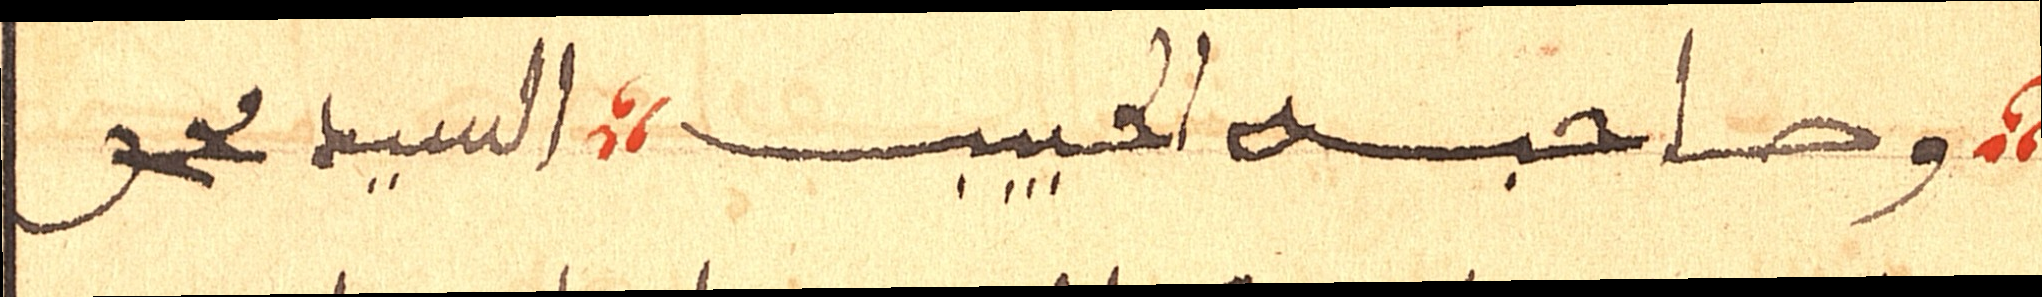وصاحبه الحبيب السيد محمد
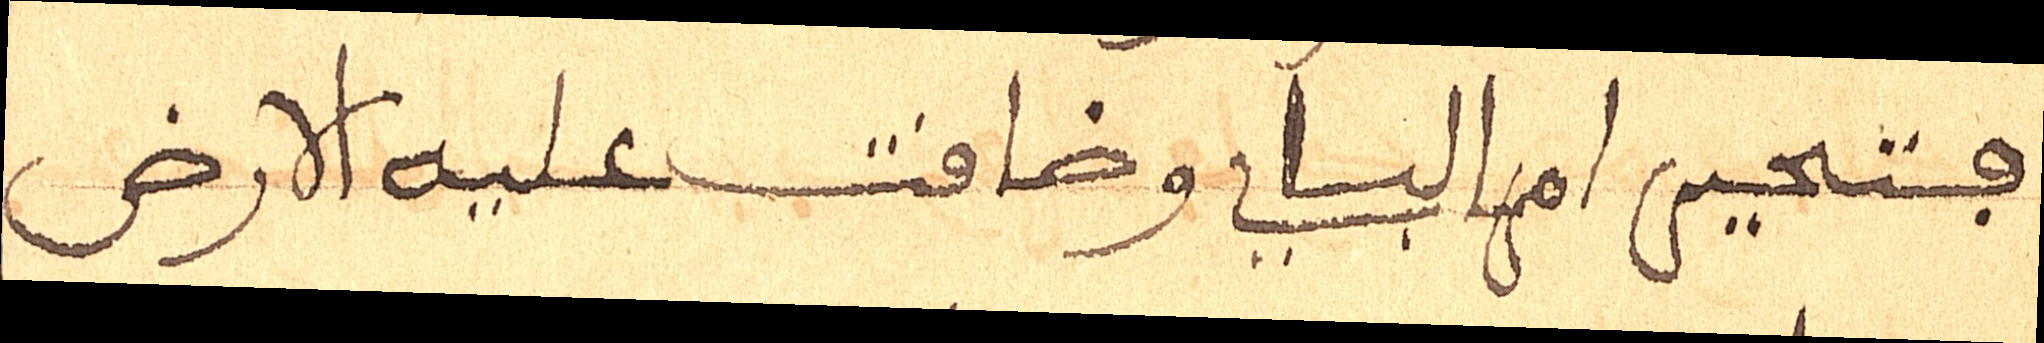فتحير امر الباي وضاقت عليه الارض
